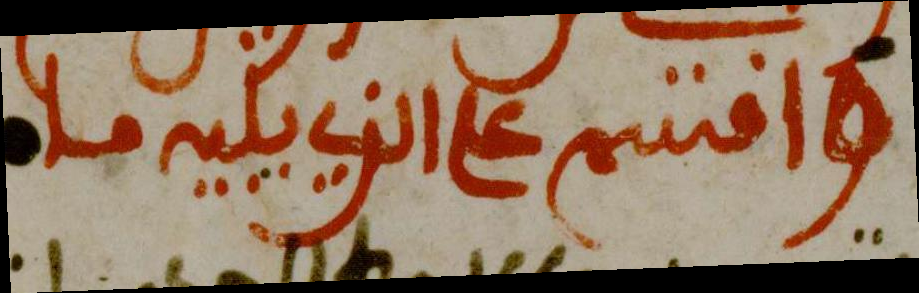واقسم على الذي يليه ما
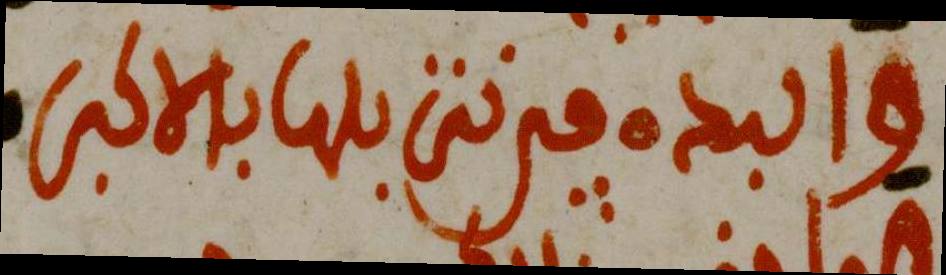والبده في تنزيلها بالكبر
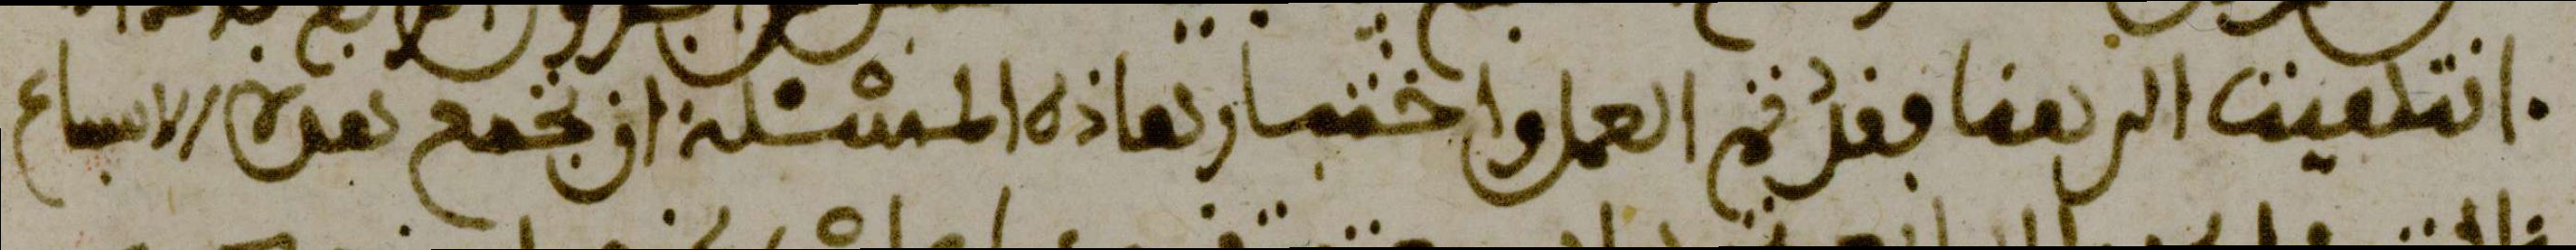انتهيت الى هذا فقدتم العمل واختبار هاذه المسْئلة ان تجمع هذا الاسباع
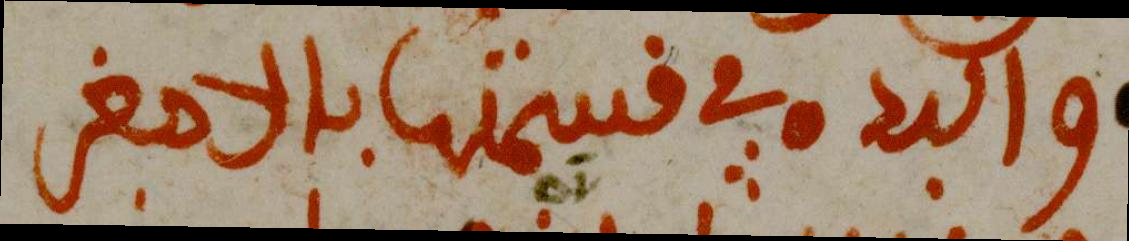والبده في قسمتها بالاصغر
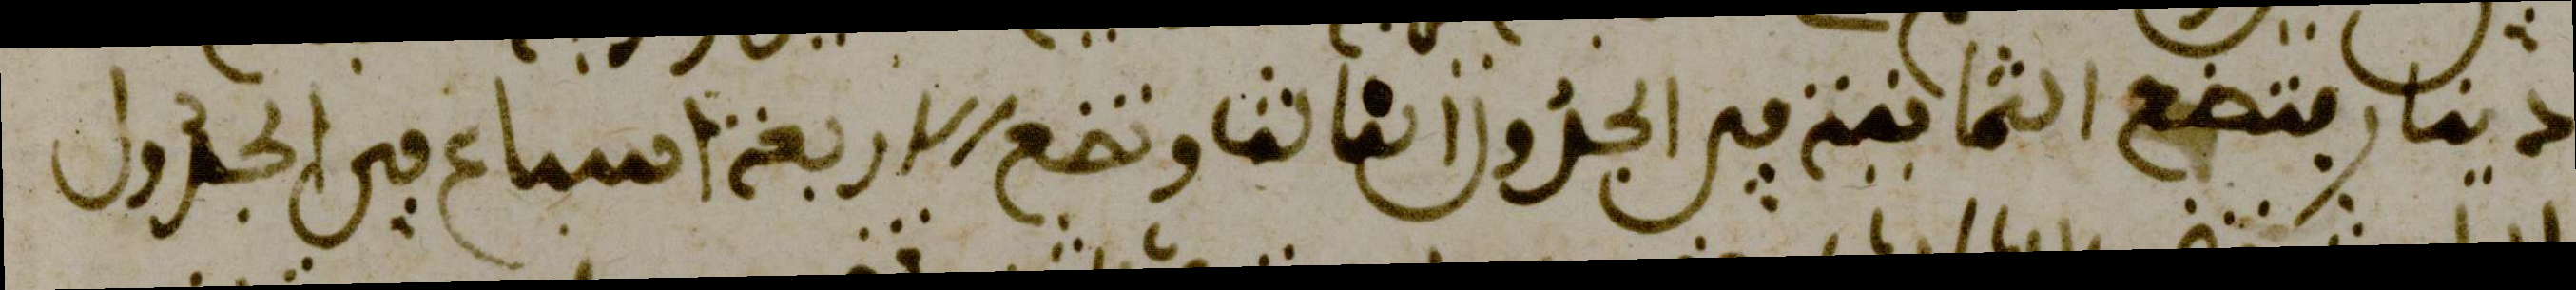دينار فتضع الثمانية في الجدول الثالث وتضع الاربعة اسباع في الجدول
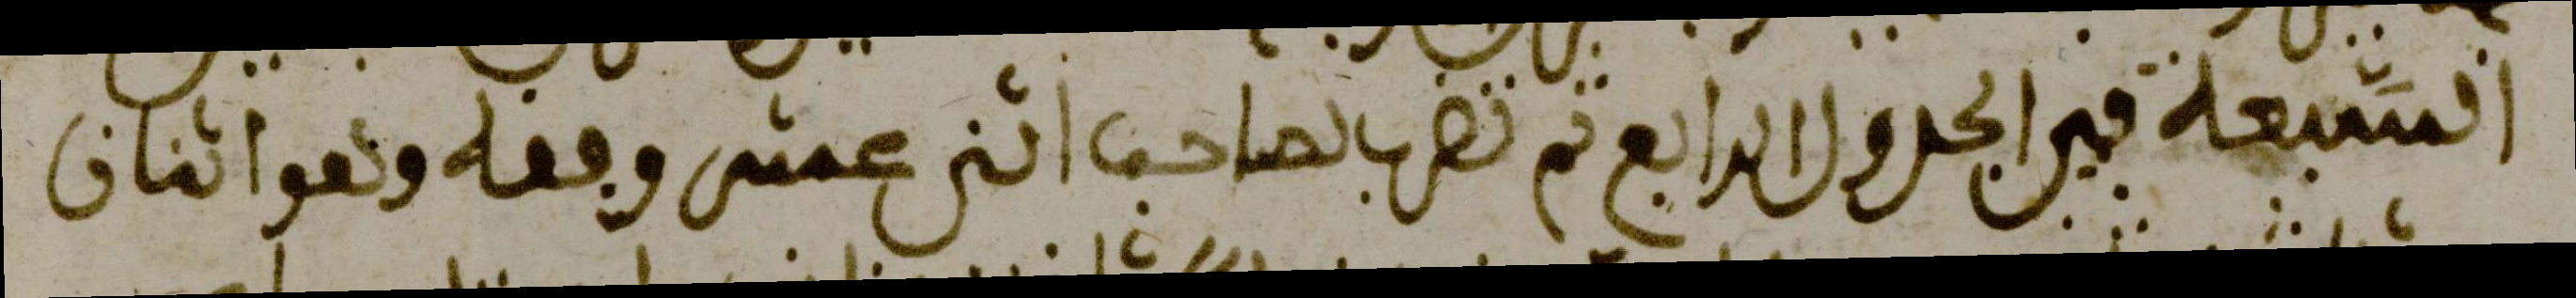السّبعة في الجدول الرابع ثم تضرب لصاحب اثنى عشر وفقه وهو اثنان
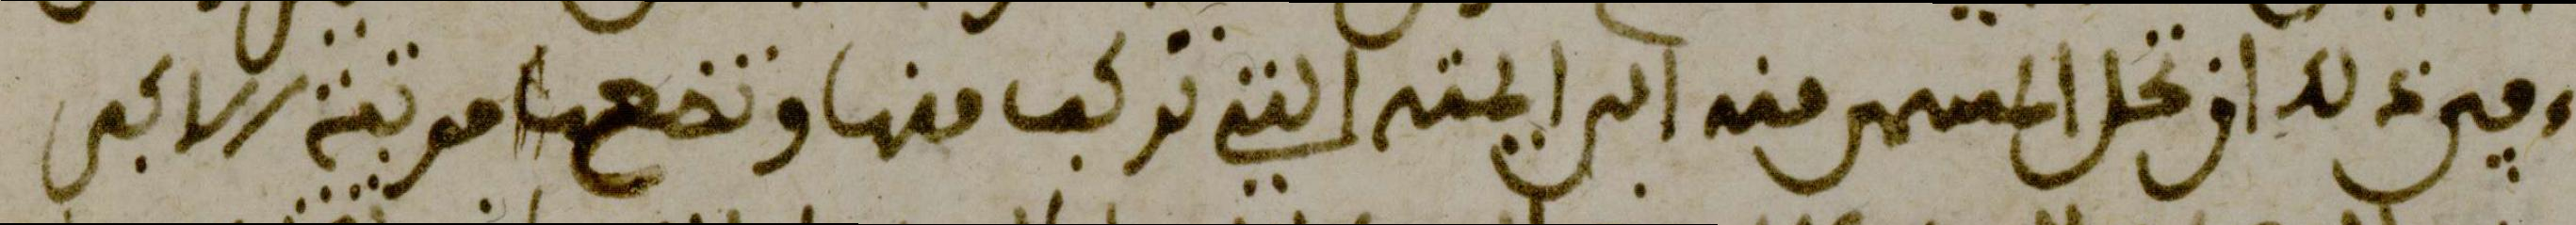في ذلك انن تحل المسمى منه الى ايمته التي تركب منها وتضعها مرتبه الاكبر
